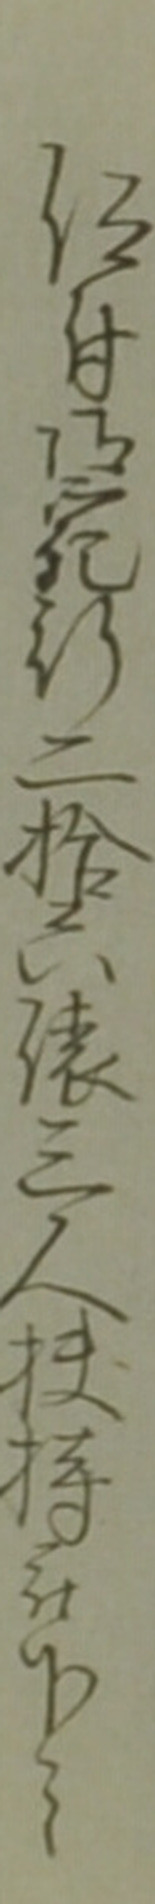仰付御宛行二拾六俵三人扶持被下之

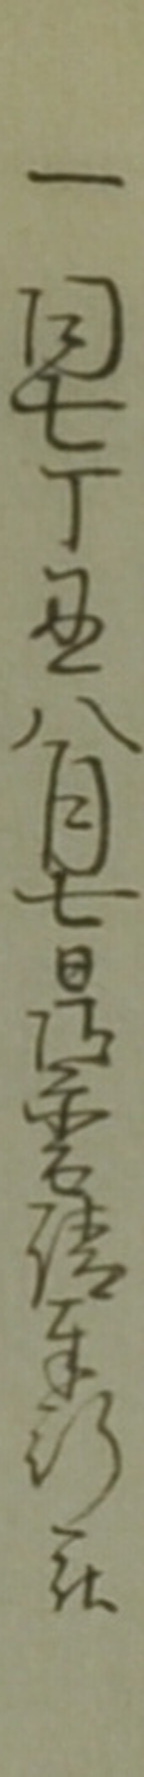一同七丁丑八月七日御普請奉行被
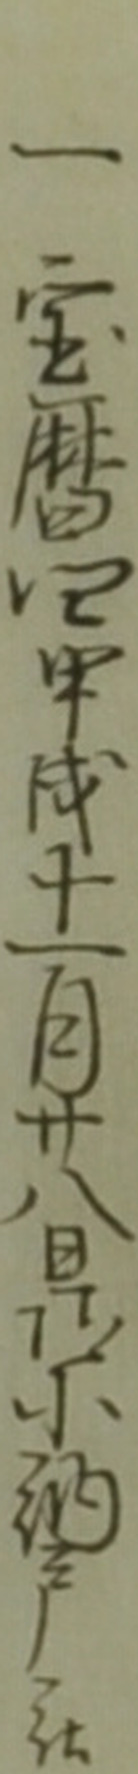一宝暦四甲戌十一月廿八日御小納戸被
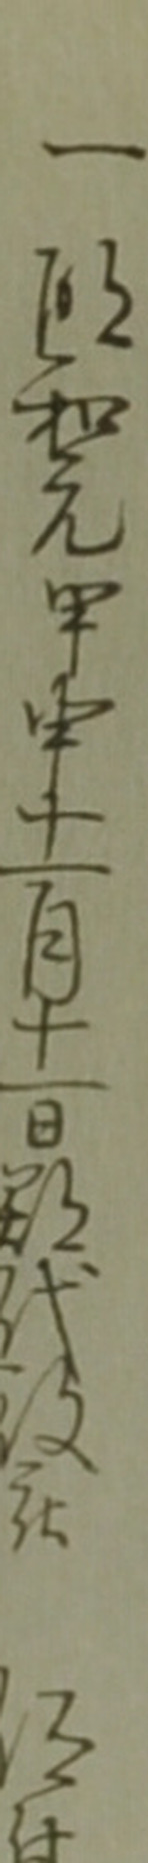一明和元甲申十一月十一日郡代役被仰付
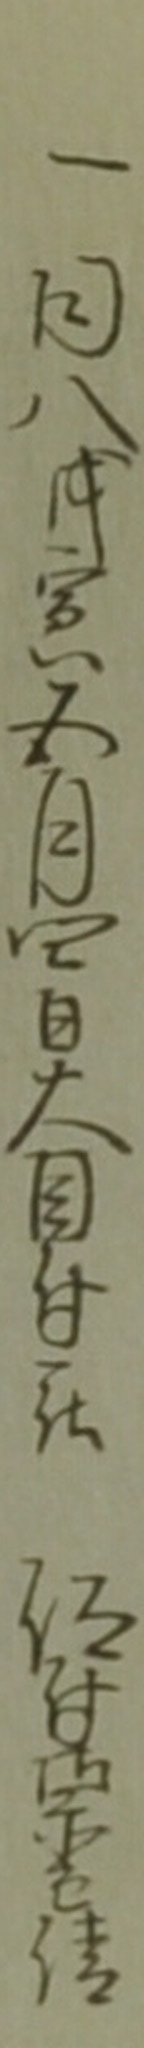一同八戊寅五月四日大目付被仰付御普請
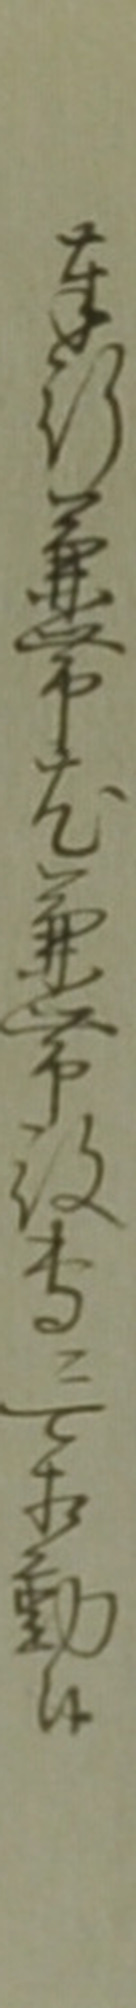奉行兼帯尤兼帯役専ニ可相勤候
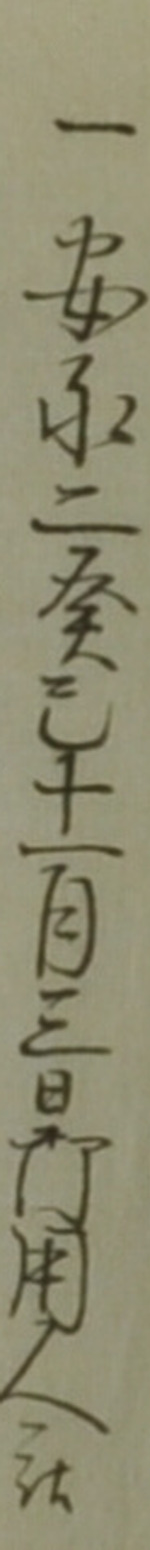一安永二癸巳十一月三日御用人被
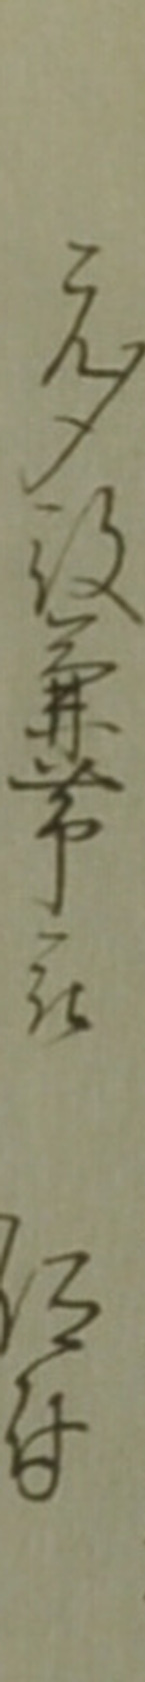元〆役兼帯被仰付
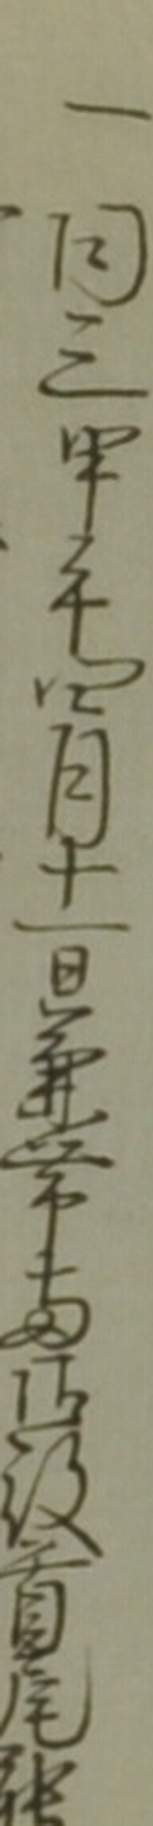一同三甲午四月十一日兼帯両役首尾能
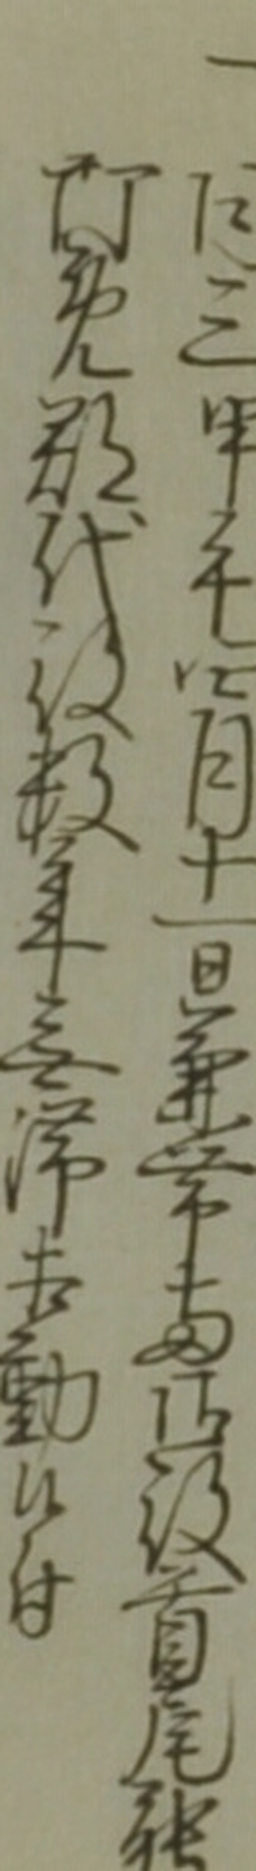御免郡代役数年無滞相勤候付
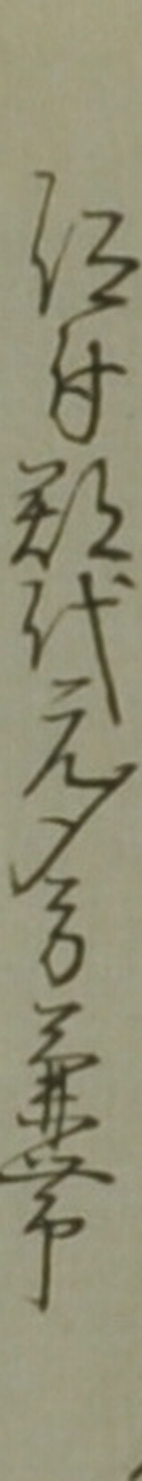仰付郡代元〆方兼帯
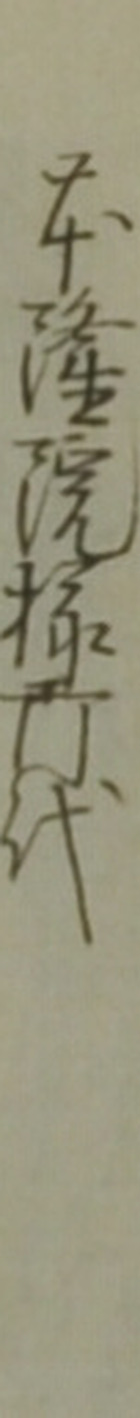本隆院様御代
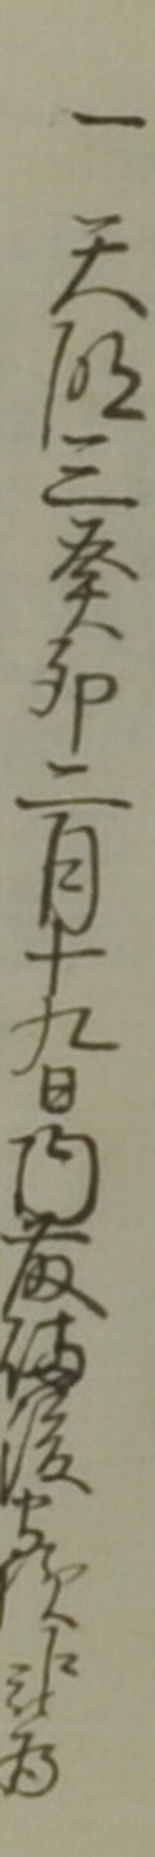一天明三癸卯二月十九日内藤備後守様江被為
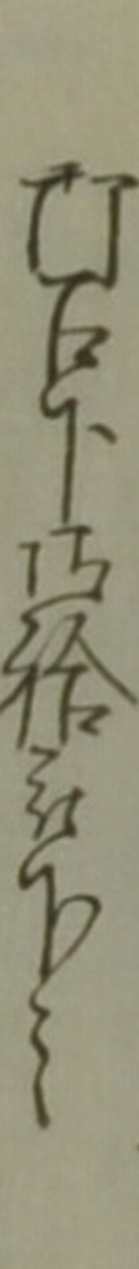御召下御袷被下之
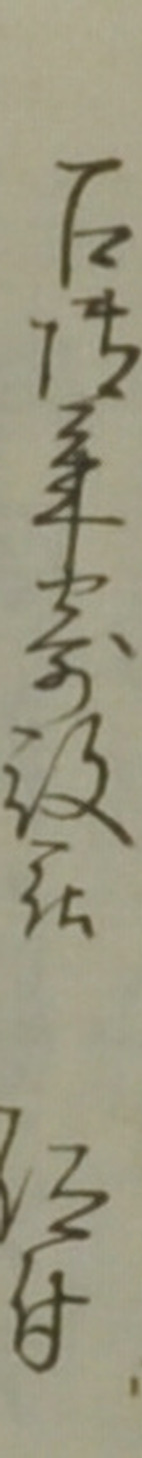召御年寄役被仰付
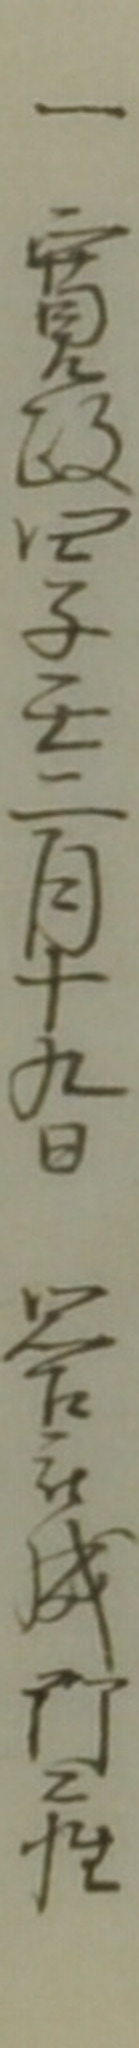一寛政四子閏二月十九日思召被成御座
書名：給人諸士勤仕録（三）
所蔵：伊那市立高遠町図書館・合同会社AMANE
